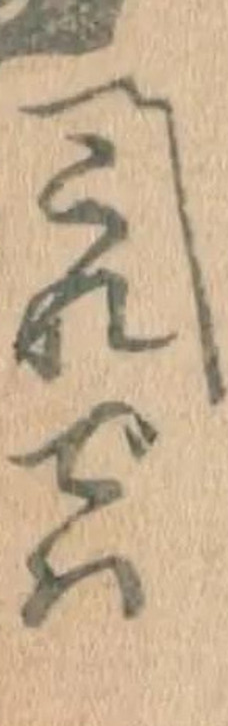〽これでは
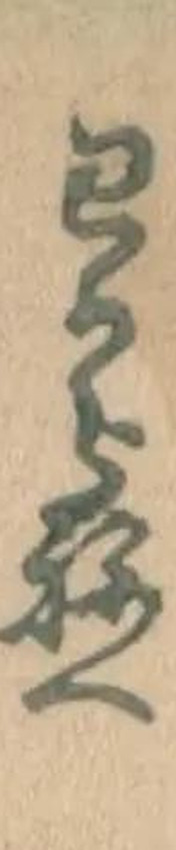わからねへ
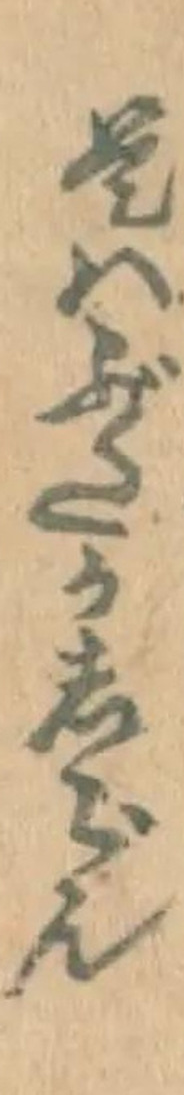是はぶたかしらん
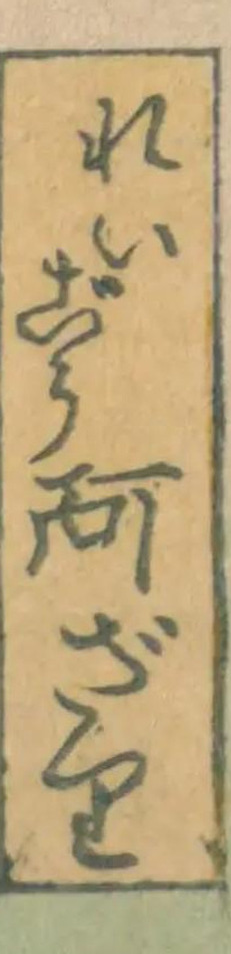れいごうあざり

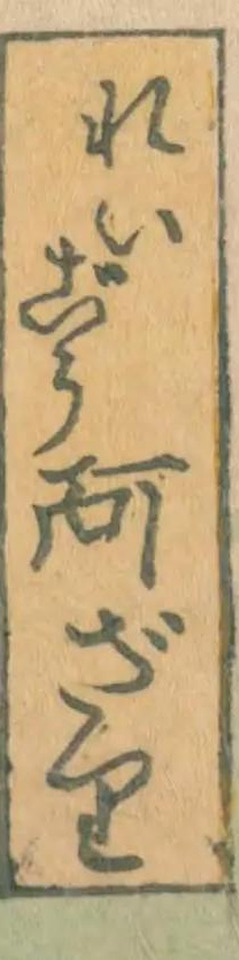れいごうあざり
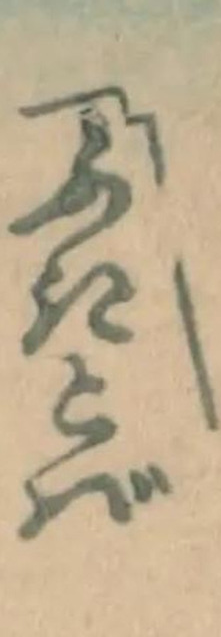〽ふきとば
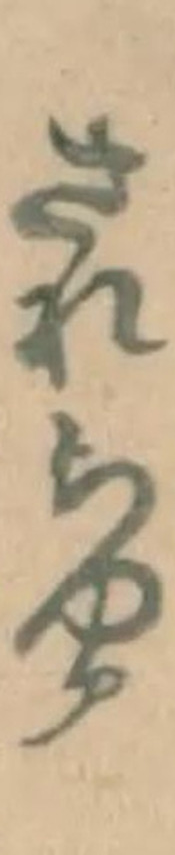されちやァ
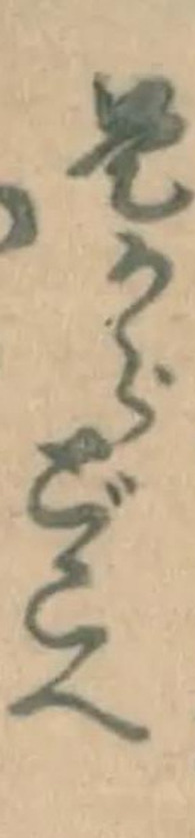是からどこへ
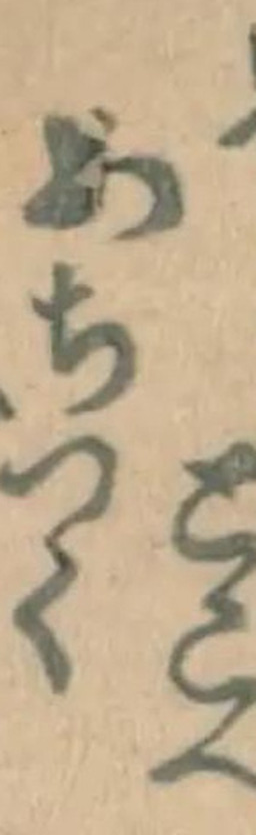おちつく
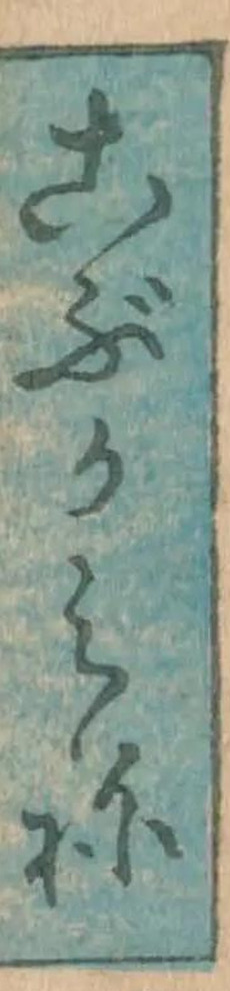こぶかみね

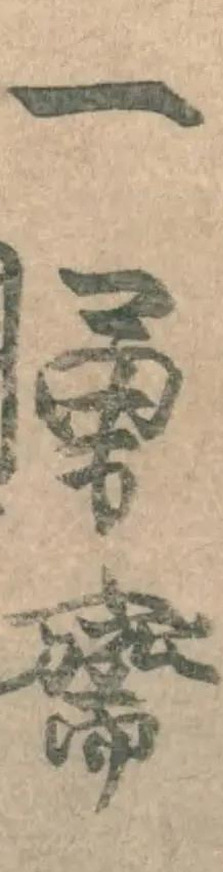一勇斎

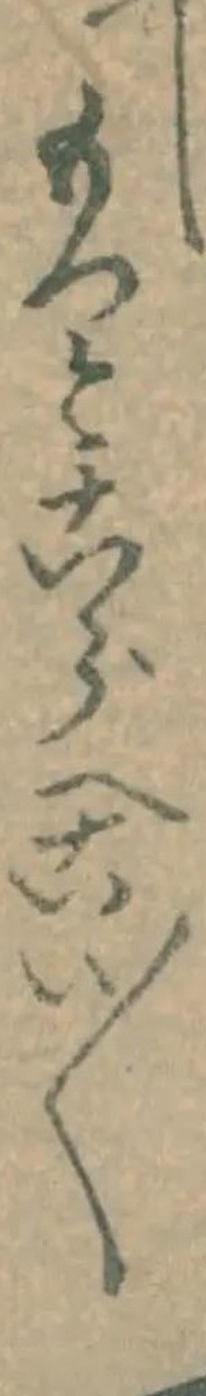〽もつとこらへこい〳〵
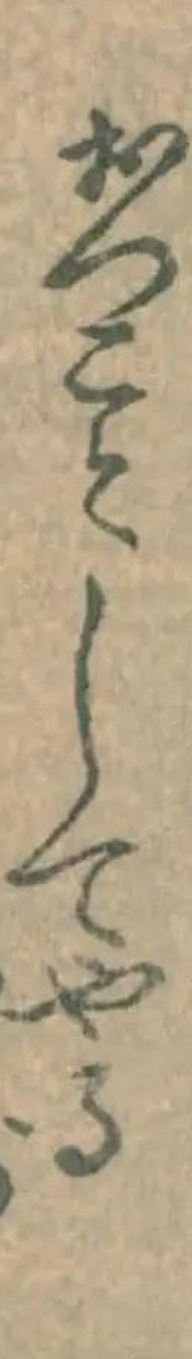おつことしてやる
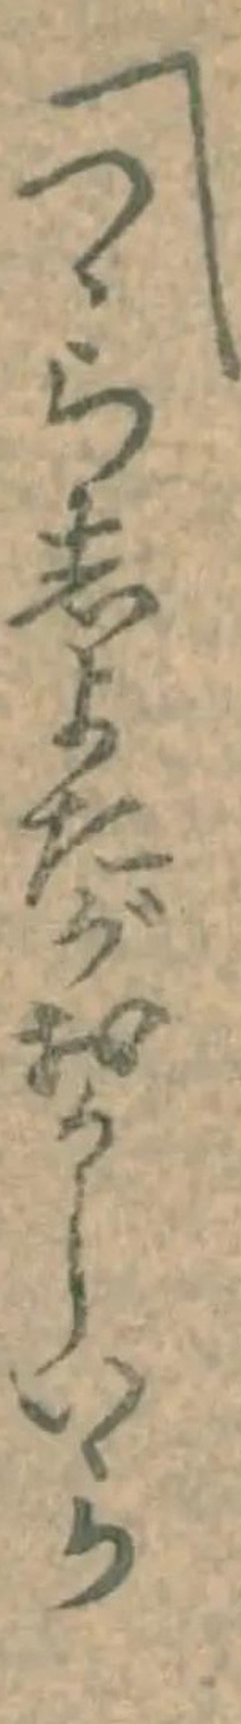〽つゝらしよたがおかしいか
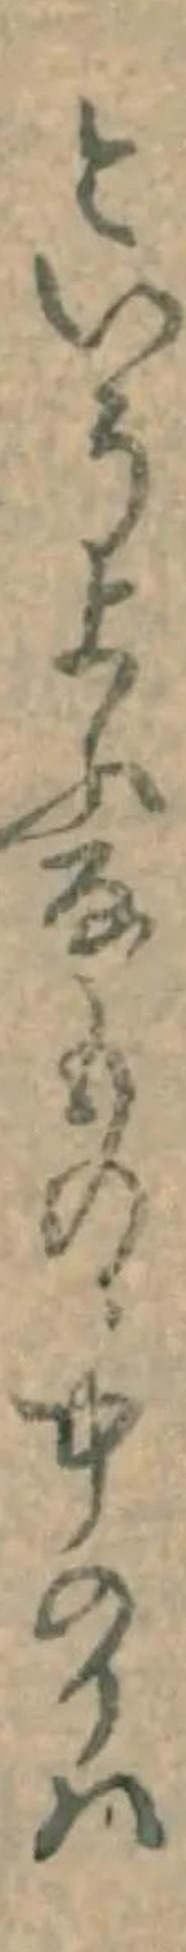というよふなものゝ中のりは
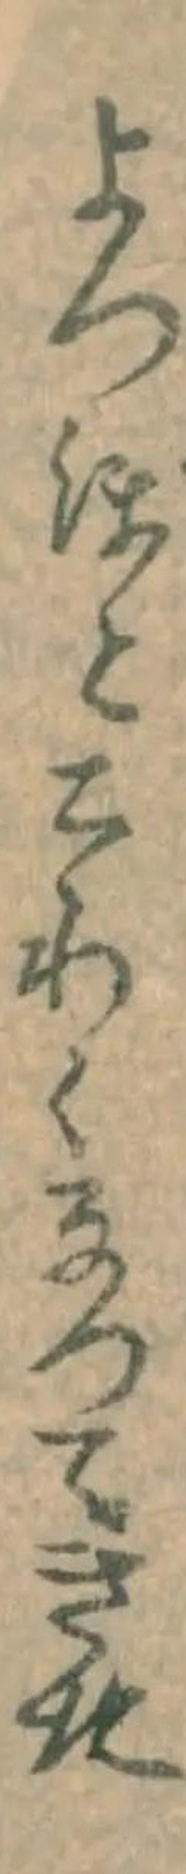よつぽとこわくなつてきた
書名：国芳国貞錦絵
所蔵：国立国会図書館 National Diet Library, JAPAN
